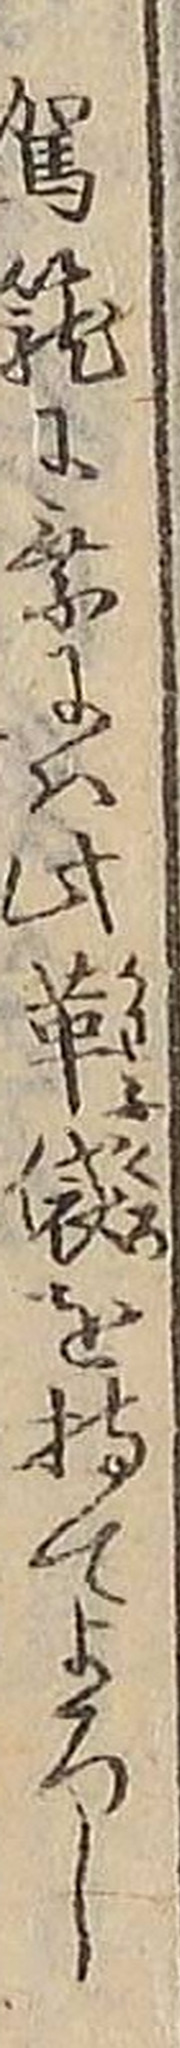駕籠に乗には此革袋を持てよろし
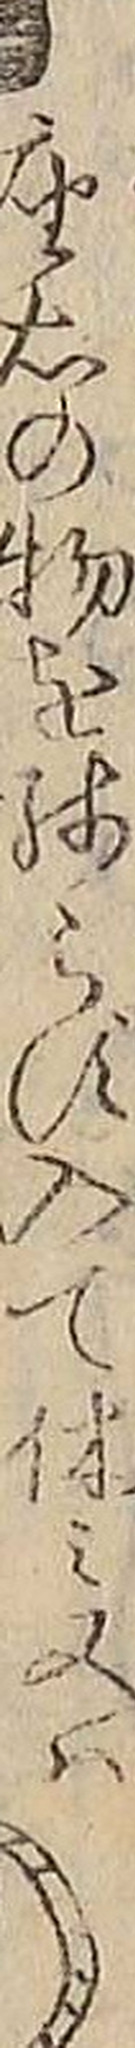座右の物を残らず入て休み又は
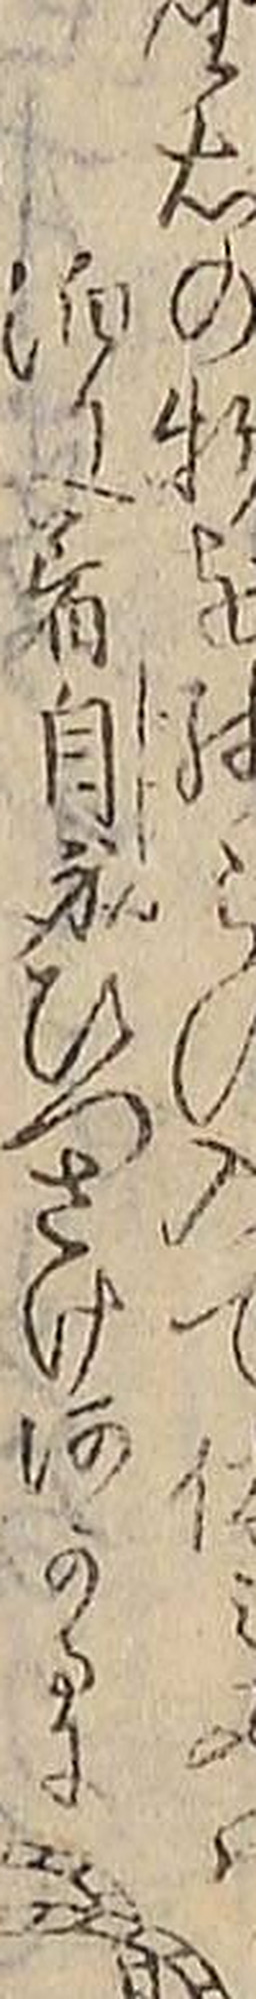泊りへ着自身ひつさけあかるに
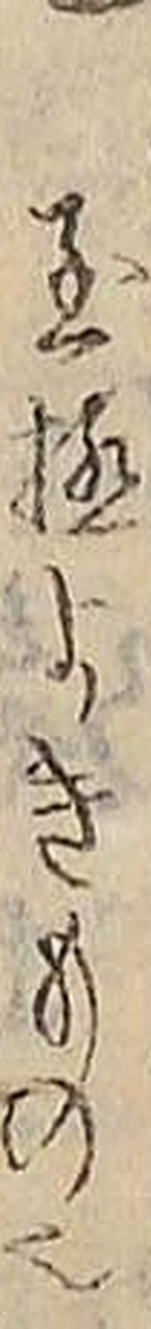至極よきもの也
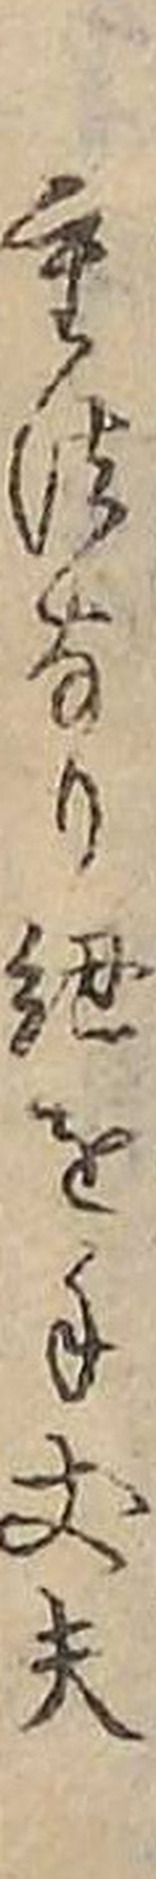重法なり紐を手丈夫
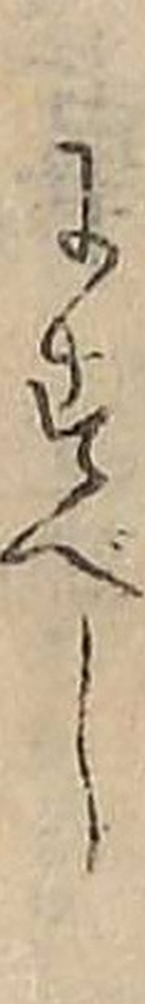にすべし

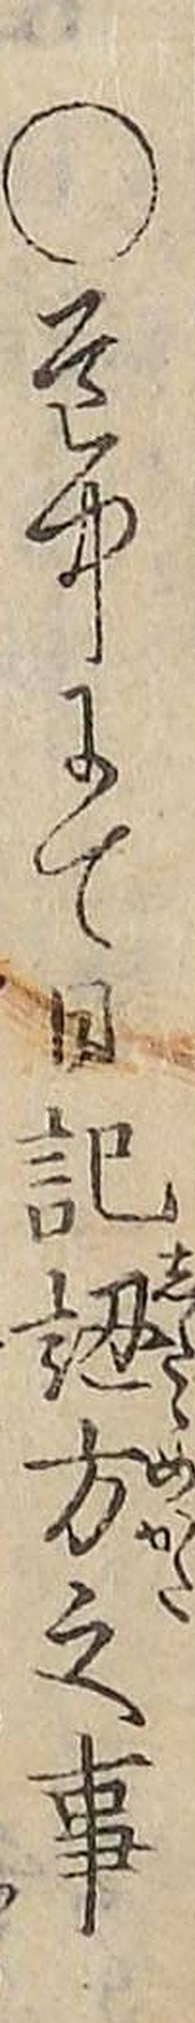○道中にて日記認方之事
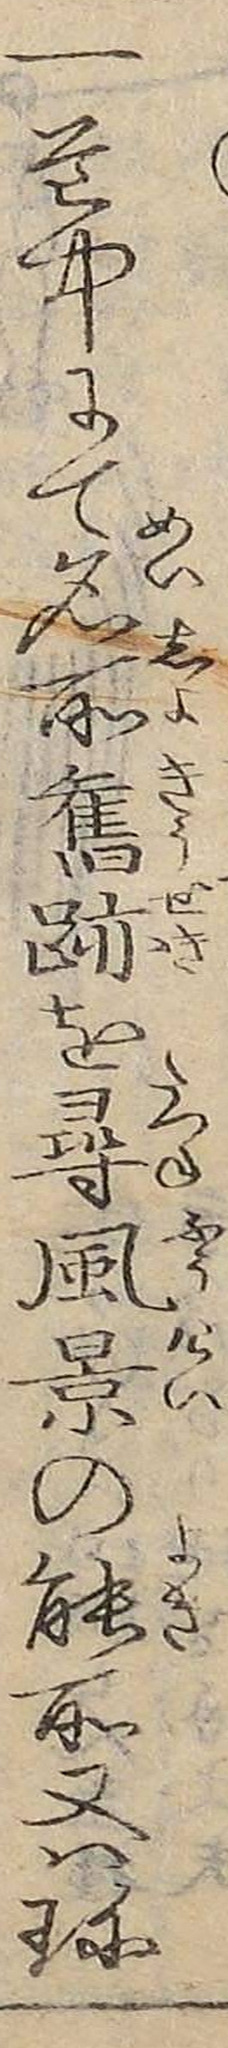一道中にて名所旧跡を尋風景の能所又は珍
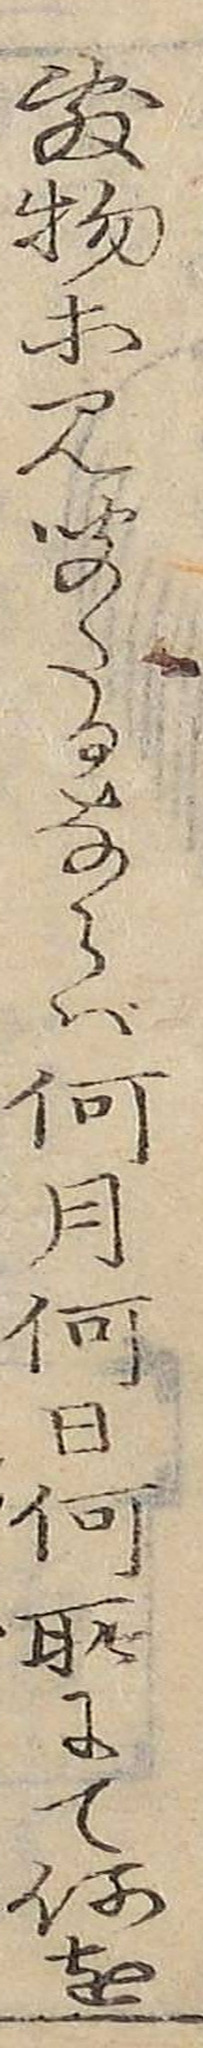敷物等見聞たるならば何月何日何所にて何を
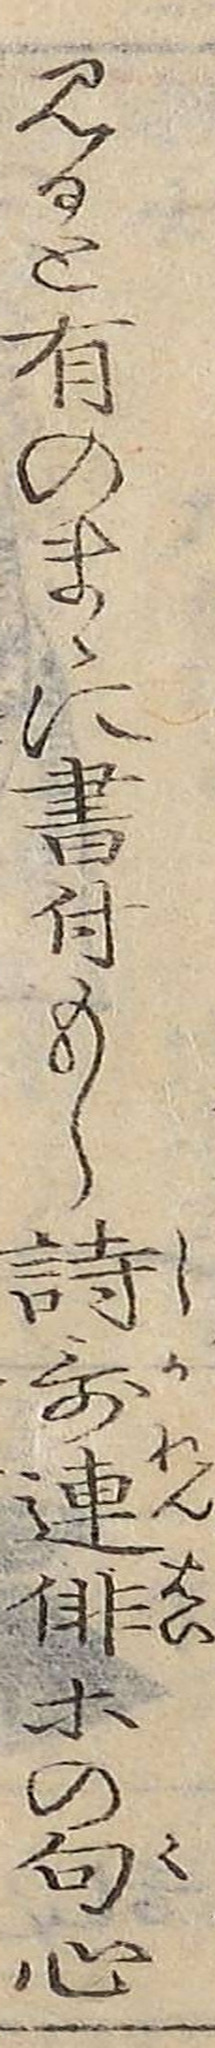見ると有のまゝに書付もし詩歌連俳等の句心
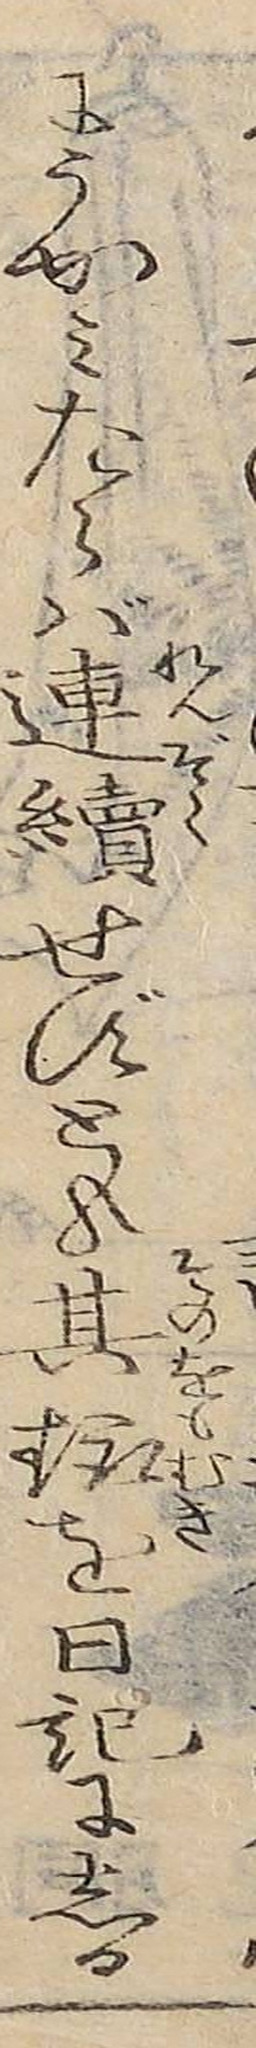にうかみたらば連続せずとも其趣を日記にしる
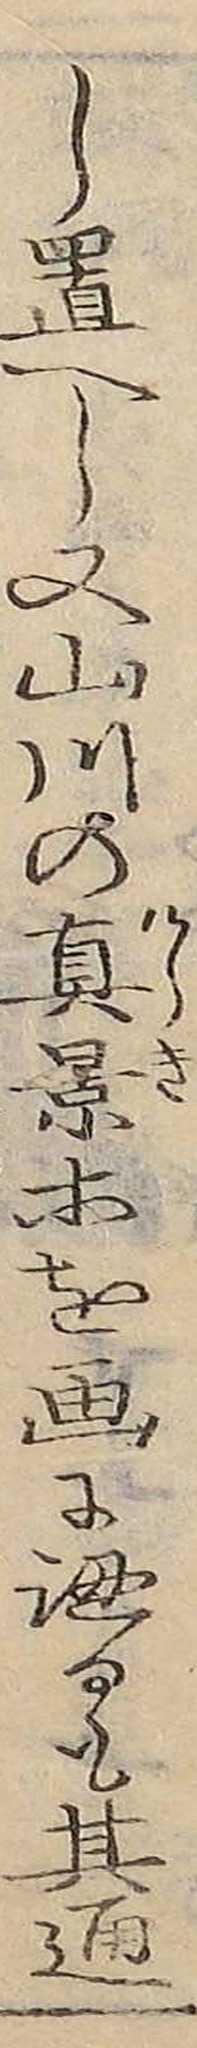し置へし又山川の真景等を画に認るも其通
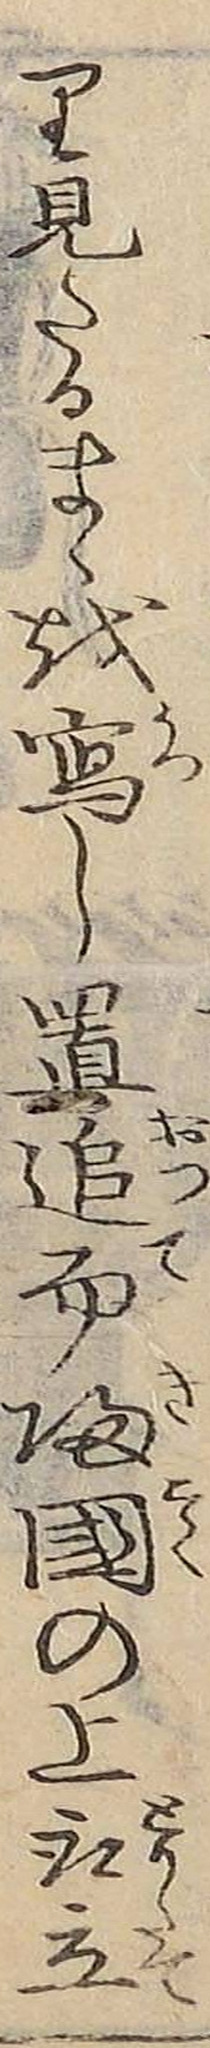り見たるまゝを写し置追而帰国の上取立
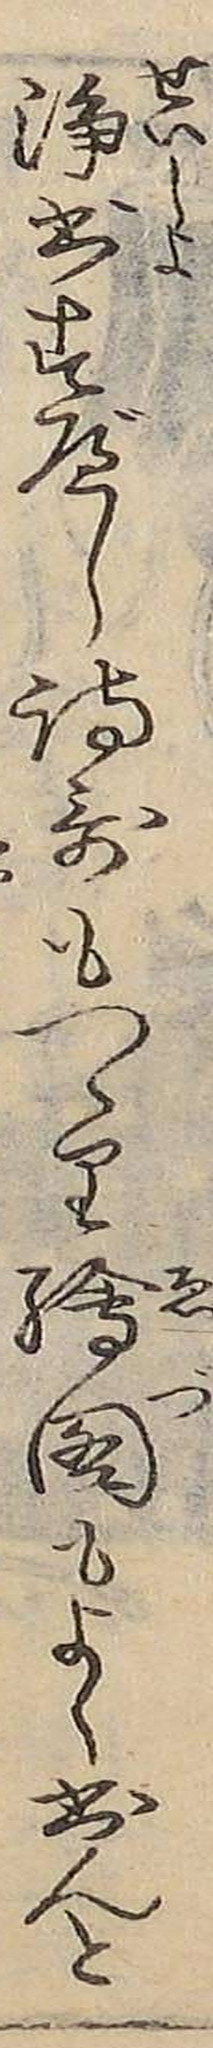浄書すべし詩歌もつゝり絵図もよく書んと
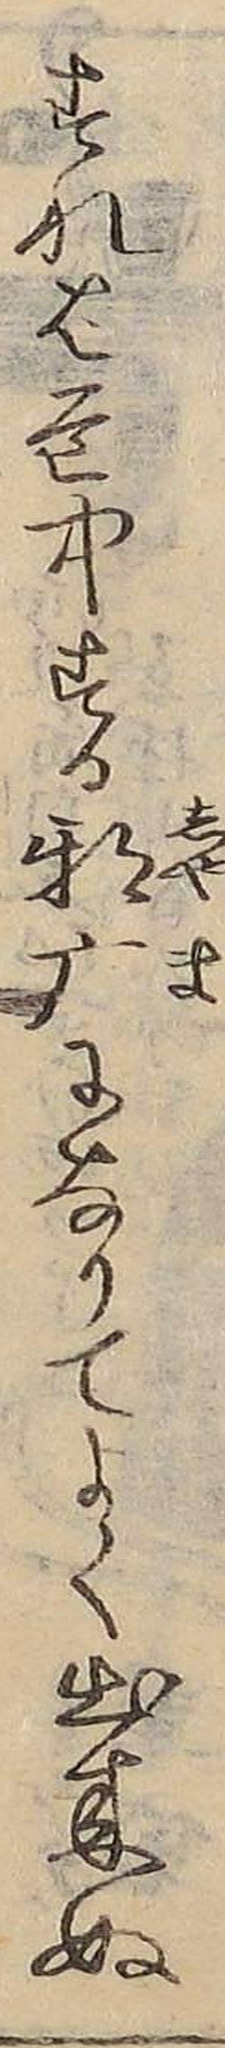すれば道中する邪魔になりてよく出来ぬ
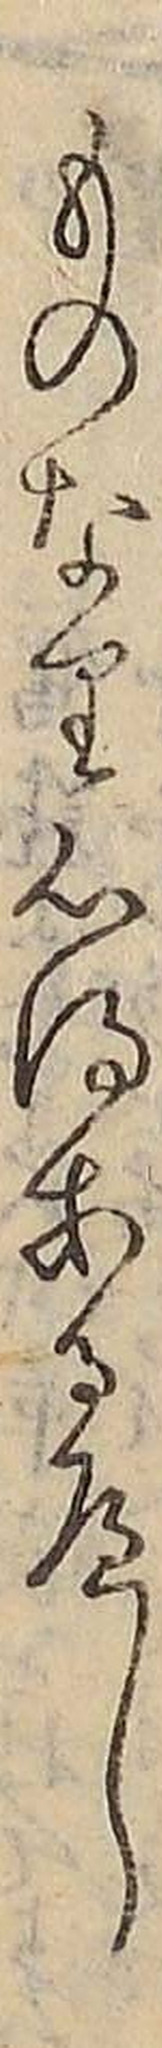ものなり心得あるへし
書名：旅行用心集
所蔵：神戸大学附属図書館 国文学研究資料館
